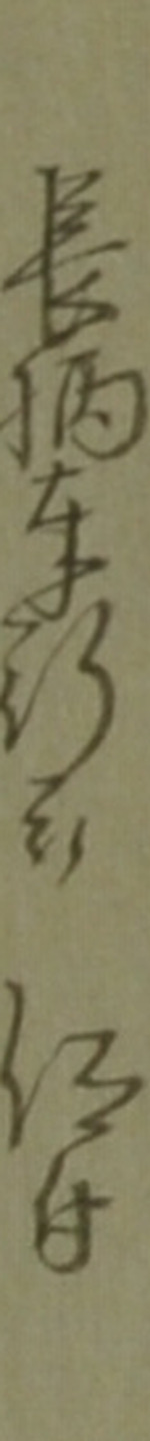長柄奉行被仰付
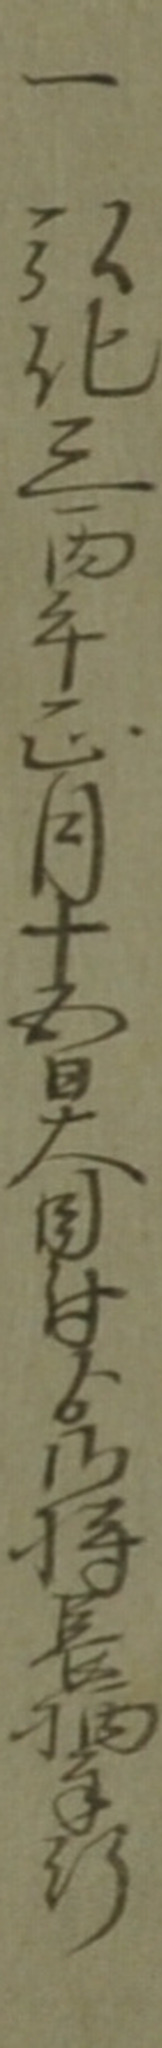一弘化三丙午正月十五日大目付ゟ御持長柄奉行
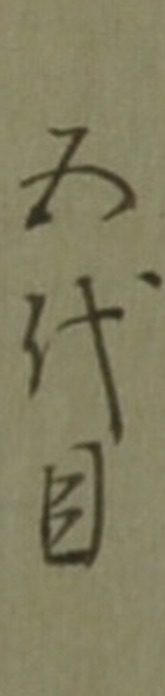五代目
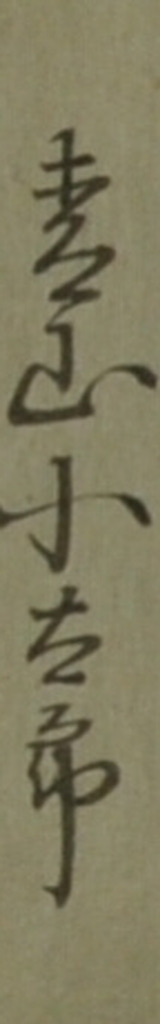青山小太郎
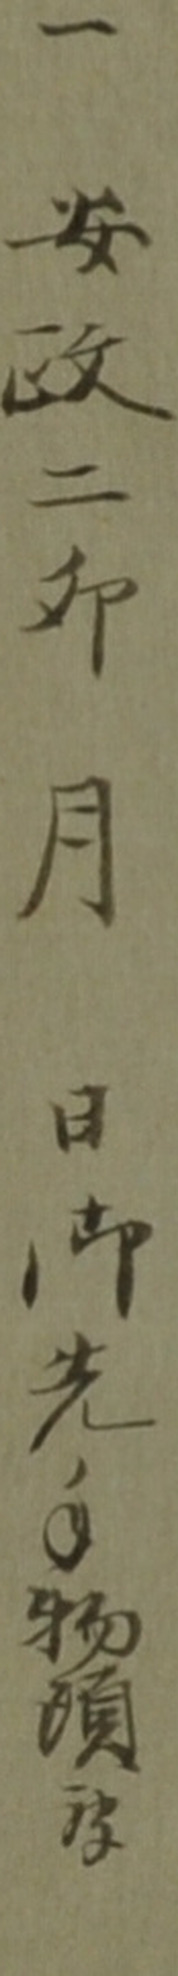一安政二卯月日御先手物頭被
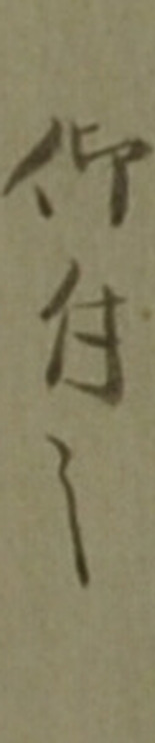仰付之
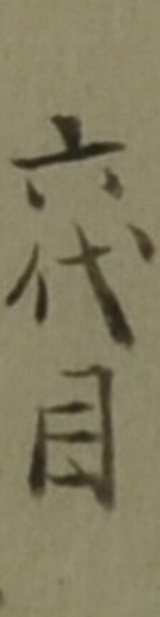六代目
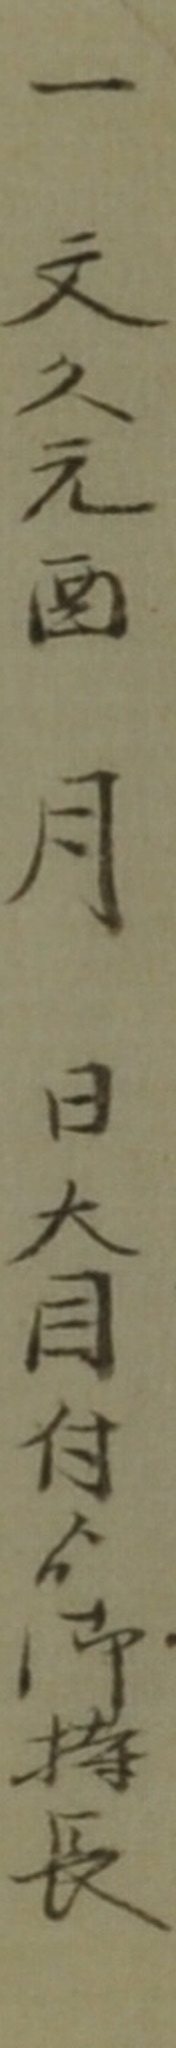一文久元酉月日大目付ゟ御持長
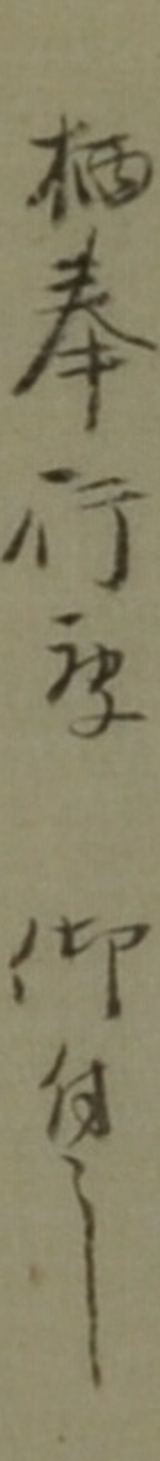柄奉行被仰付之
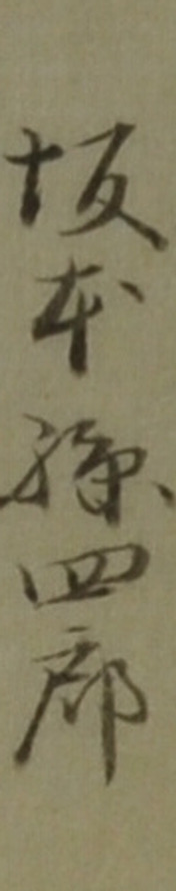一坂本孫四郎

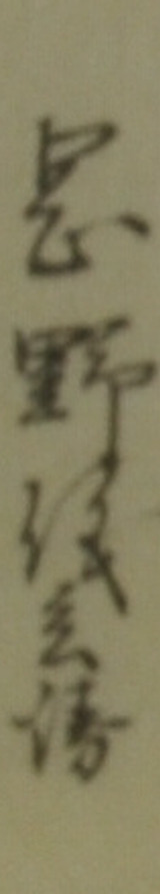岡野儀兵衛

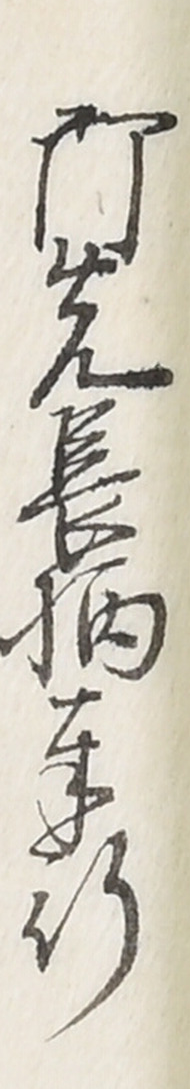御先長柄奉行
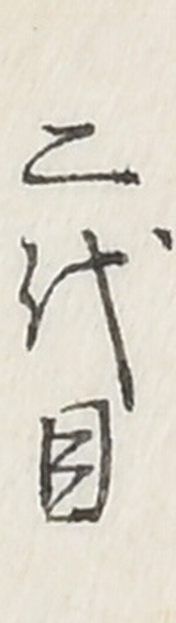二代目
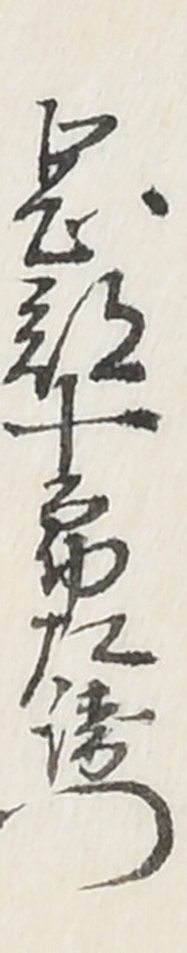岡部十郎左衛門
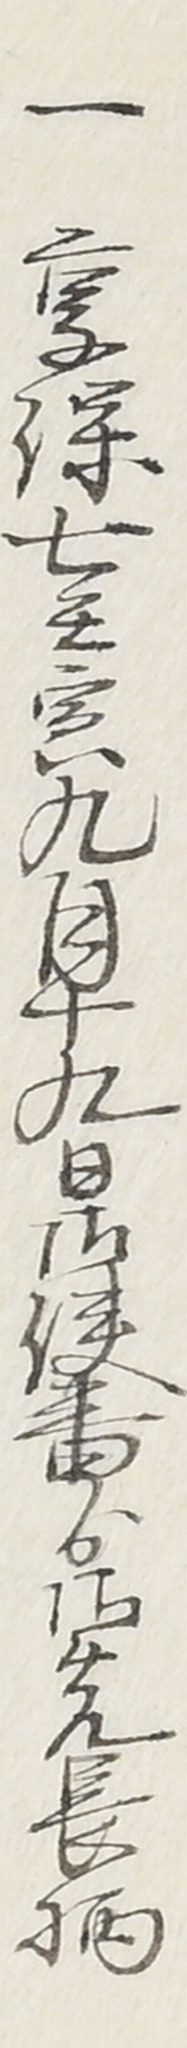一享保七壬寅九月十九日御使番ゟ御先長柄
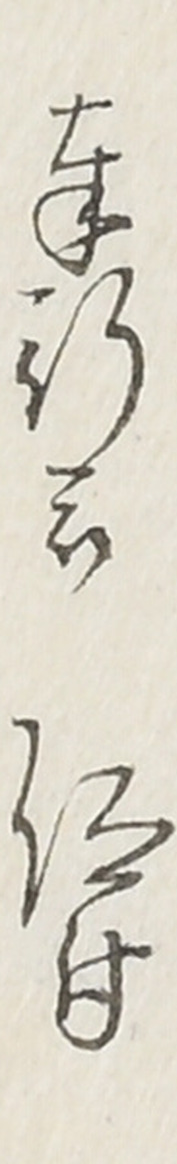奉行被仰付
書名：諸御役代々録（三）
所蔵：伊那市立高遠町図書館・合同会社AMANE
